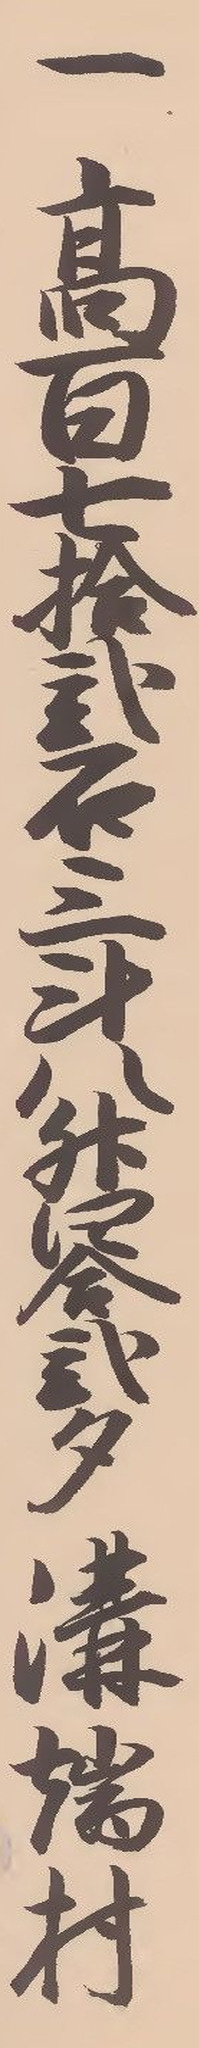一高百七拾弐石三斗八升四合弐勺溝端村
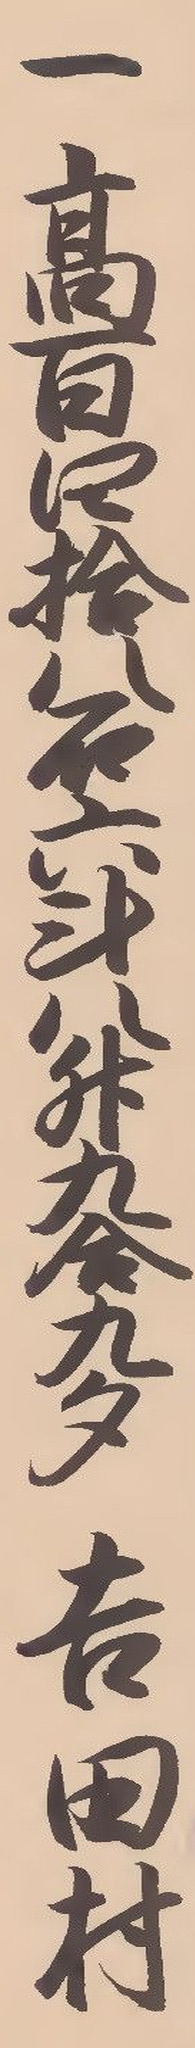一高百四拾八石六斗八升九合九勺吉田村
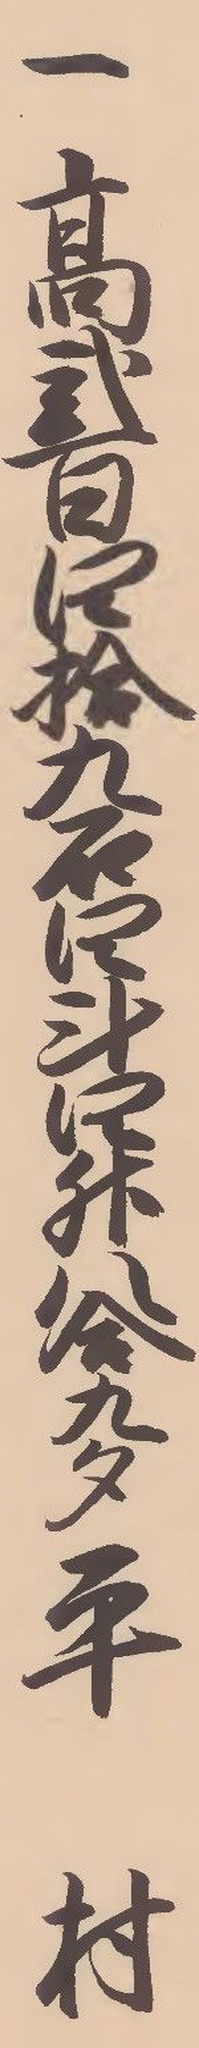一高弐百四拾九石四斗四升八合九勺平村
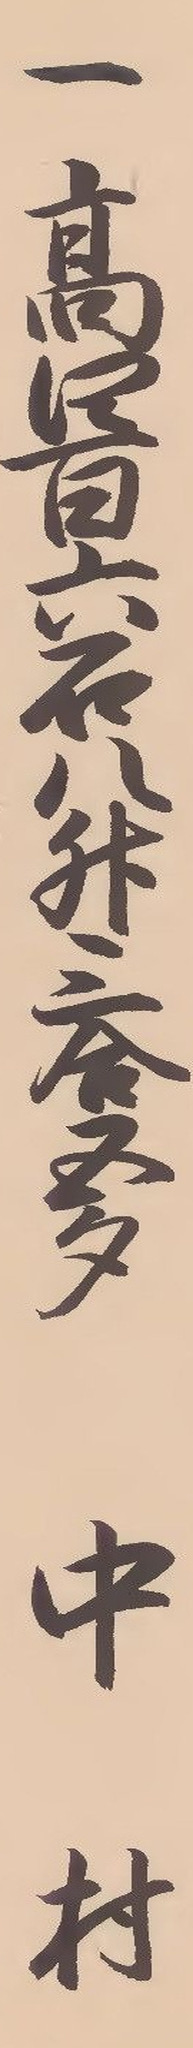一高四百六石八升三合五勺中村
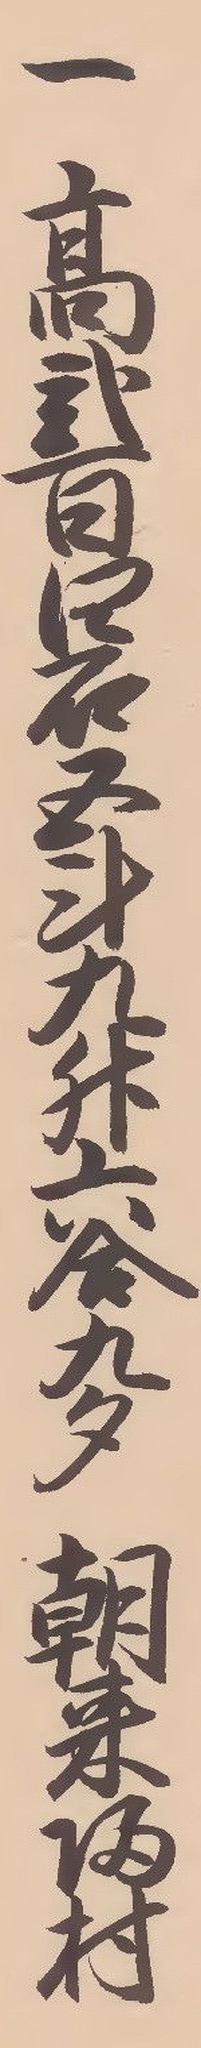一高弐百四石五斗九升六合九勺朝来帰村

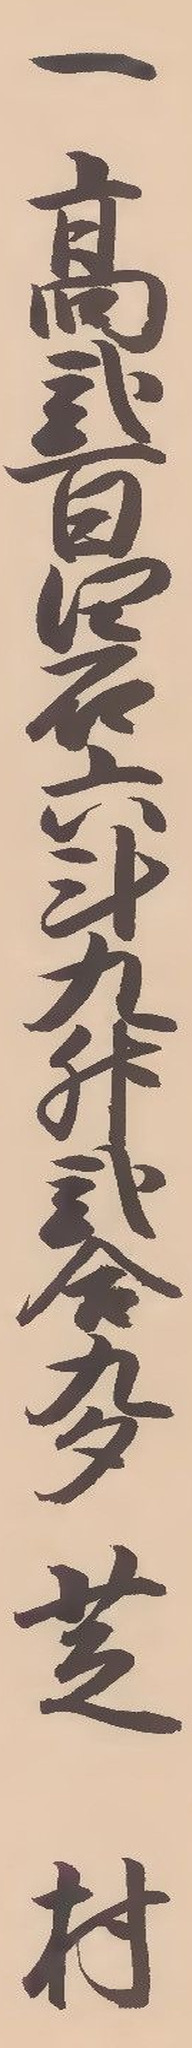一高弐百四石六斗九升弐合九勺芝村
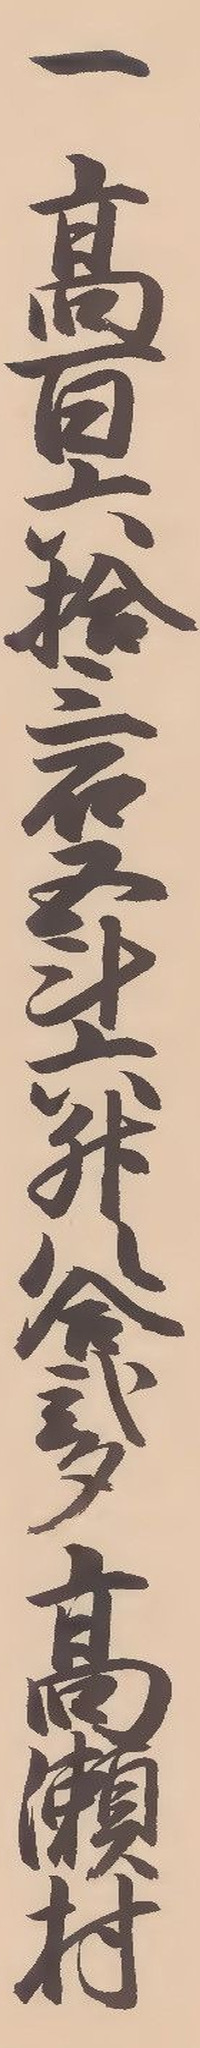一高百六拾三石五斗六升八合弐勺高瀬村
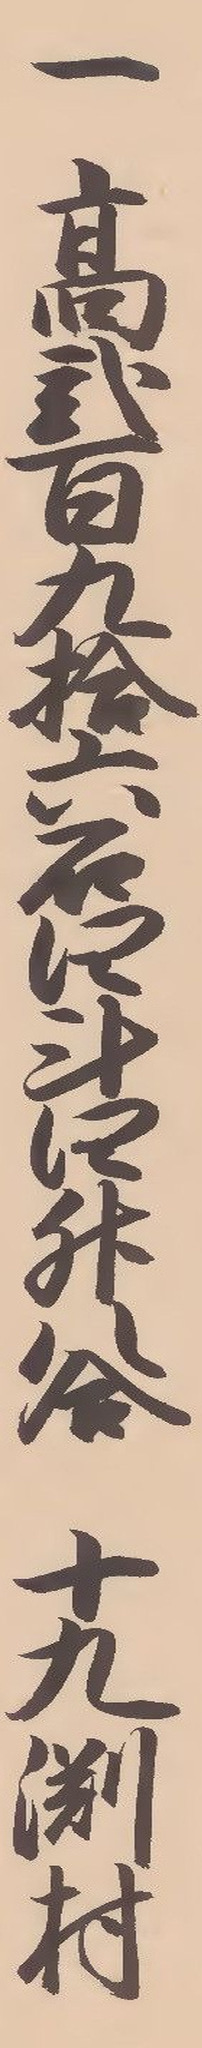一高弐百九拾六石四斗四升八合十九渕村
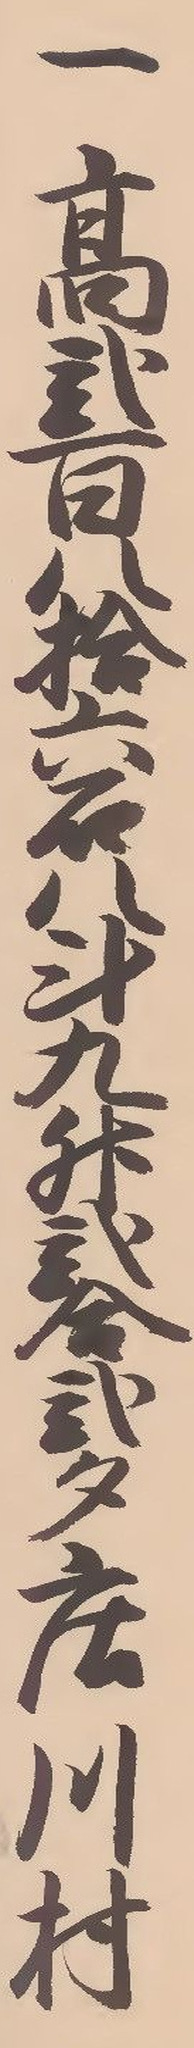一高弐百八拾六石八斗九升弐合弐勺庄川村
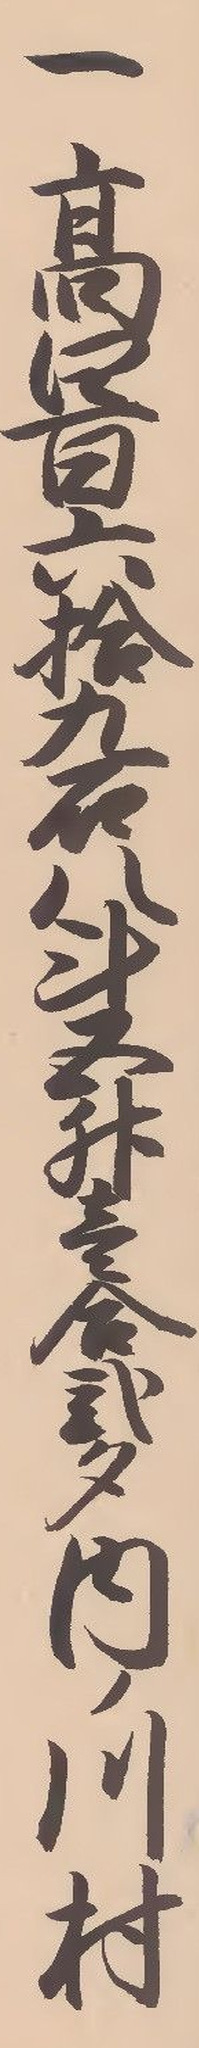一高四百六拾九石八斗五升壱合弐勺内ノ川村
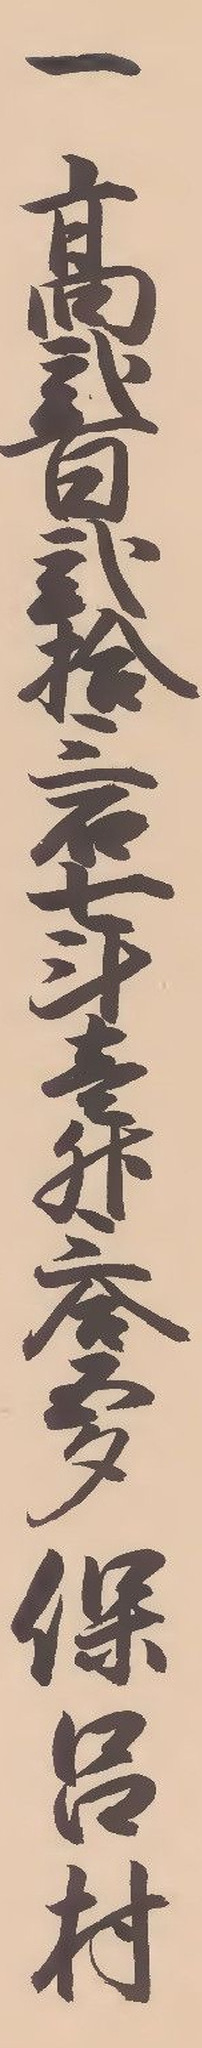一高弐百弐拾三石七斗壱升三合五勺保呂村
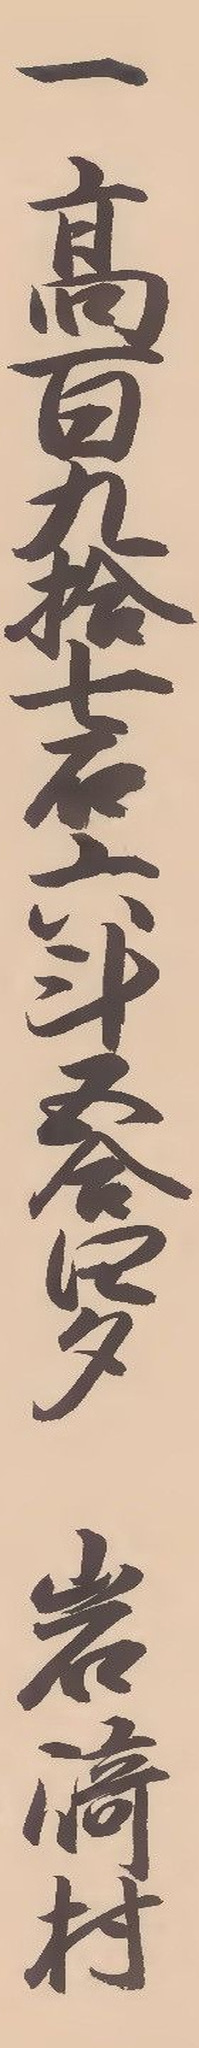一高百九拾七石六斗五合四勺岩崎村

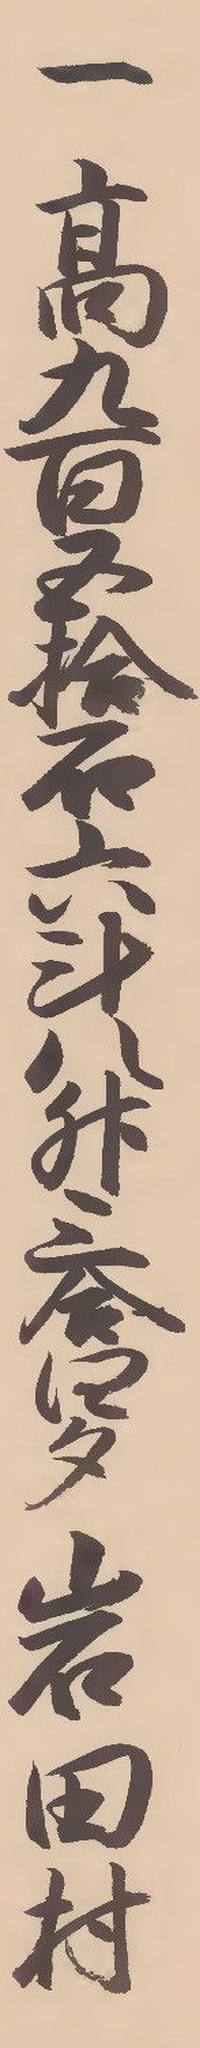一高九百五拾石六斗八升三合四勺岩田村
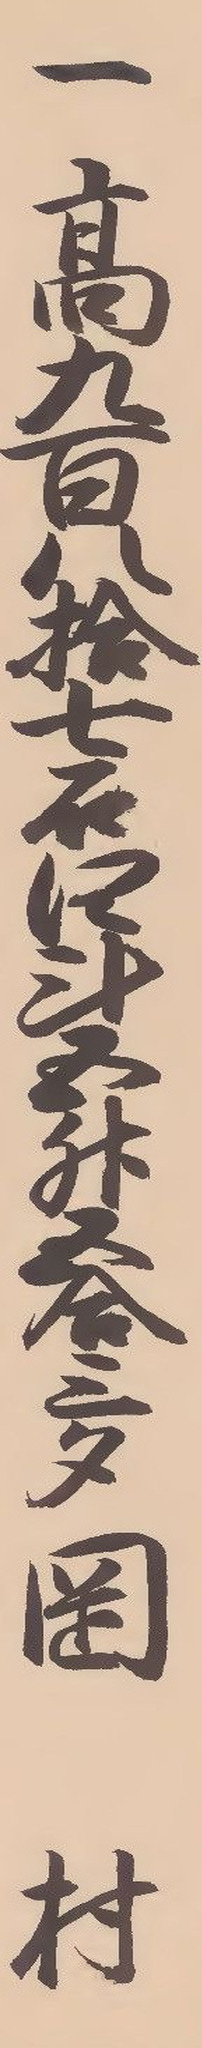一高九百八拾七石四斗五升五合三勺岡村
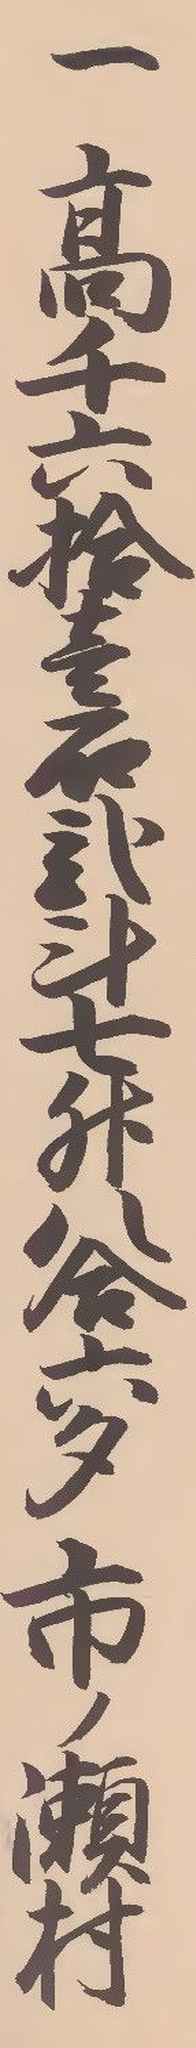一高千六拾壱石弐斗七升八合六勺市ノ瀬村
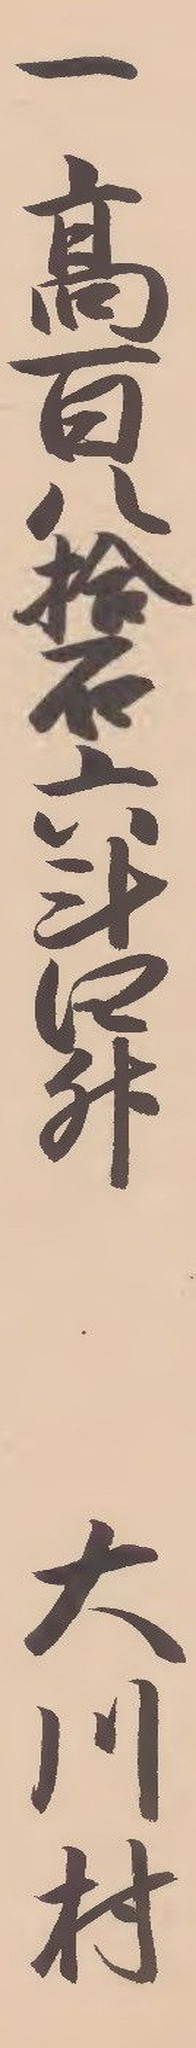一高百八拾石六斗四升大川村
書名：紀伊国郷帳
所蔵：国立公文書館 National Archives of Japan
